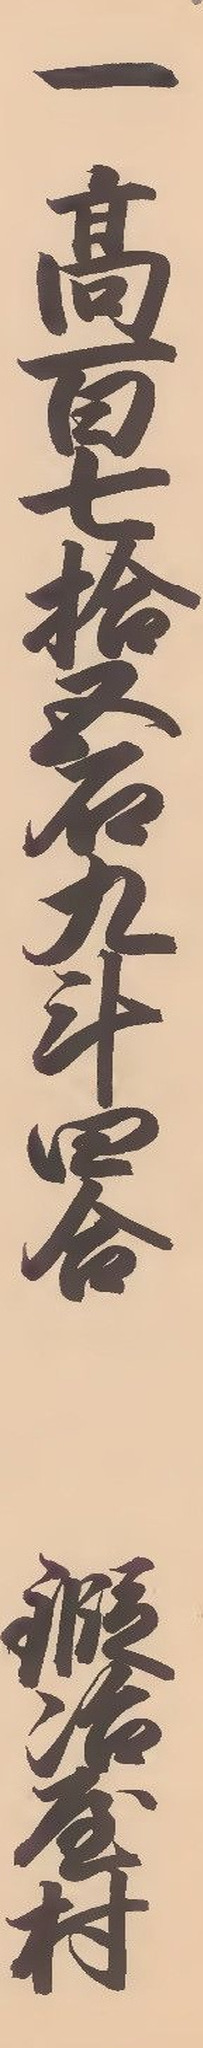一高百七拾五石九斗四合鍛冶屋村
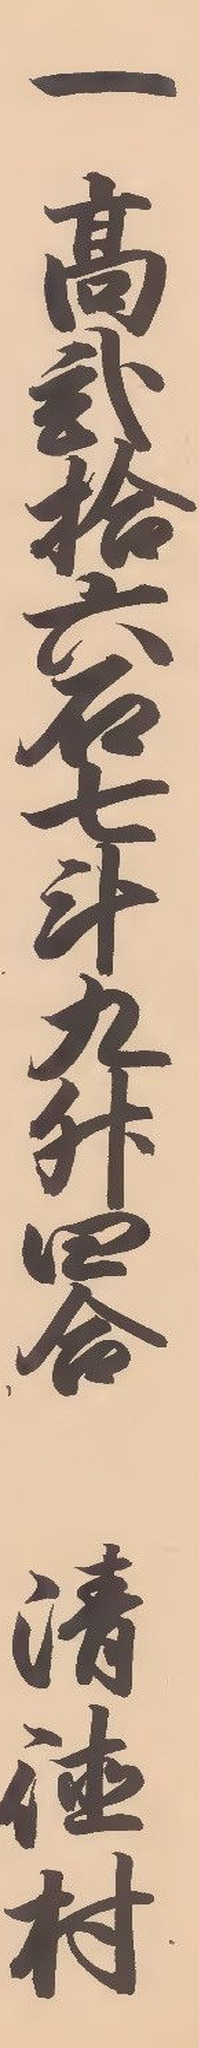一高弐拾六石七斗九升四合清徳村
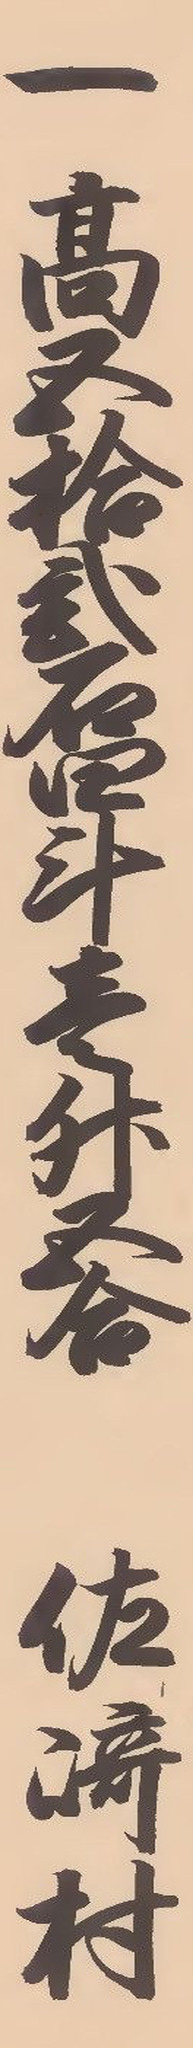一高五拾弐石四斗壱升五合佐崎村
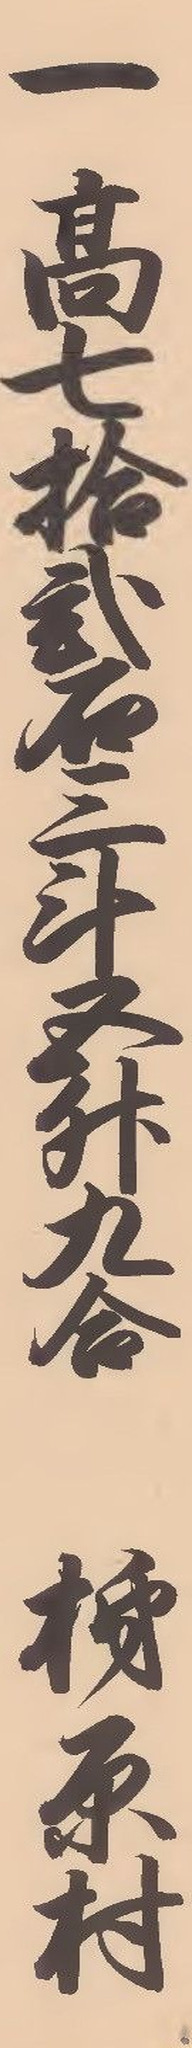一高七拾弐石三斗五升九合柿原村
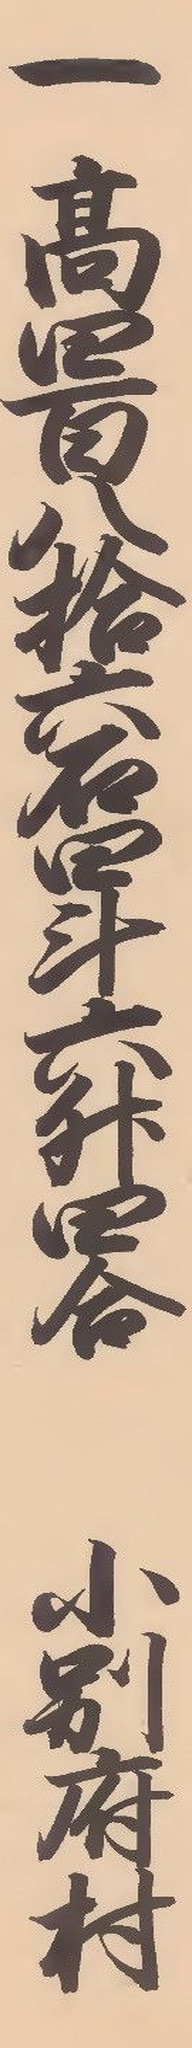一高四百八拾六石四斗六升四合小別府村

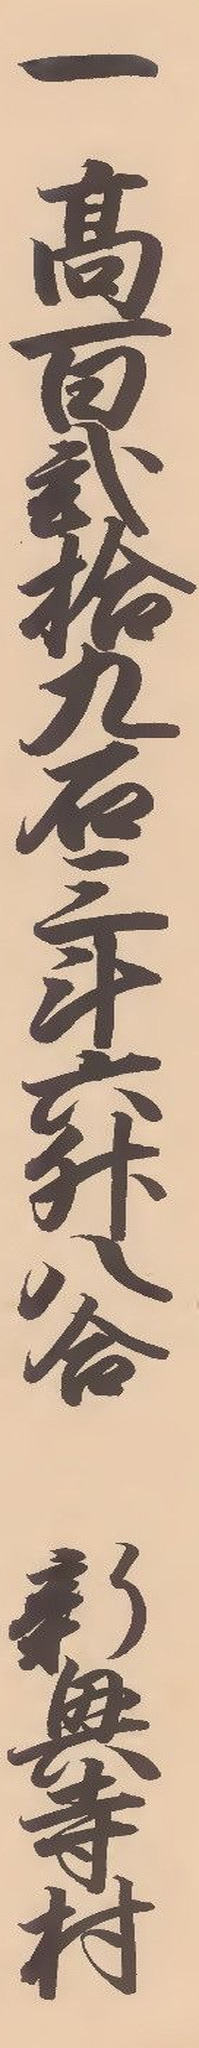一高百弐拾九石三斗六升八合新興寺村
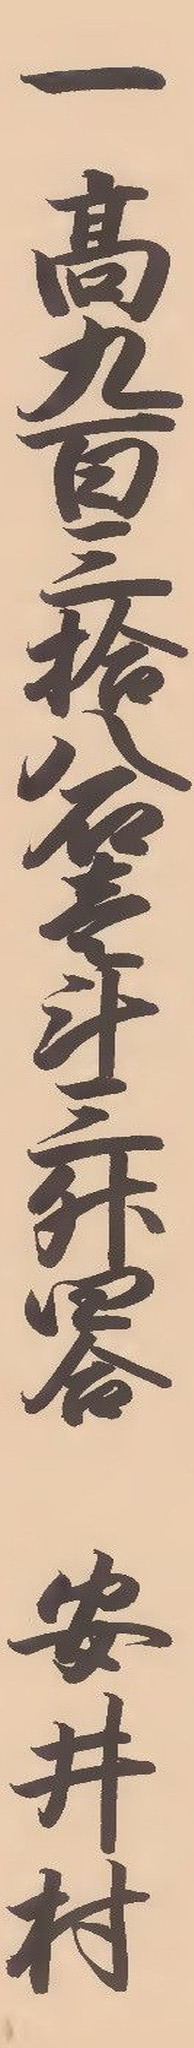一高九百三拾八石壱斗三升四合安井村
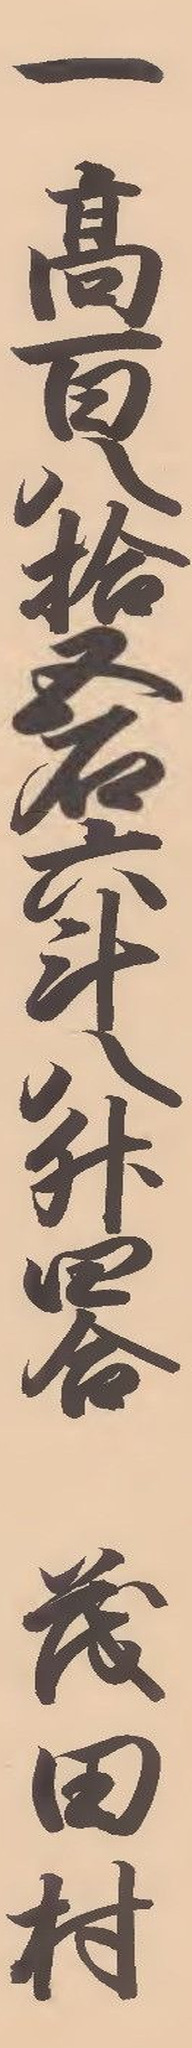一高百八拾五石六斗八升四合茂田村
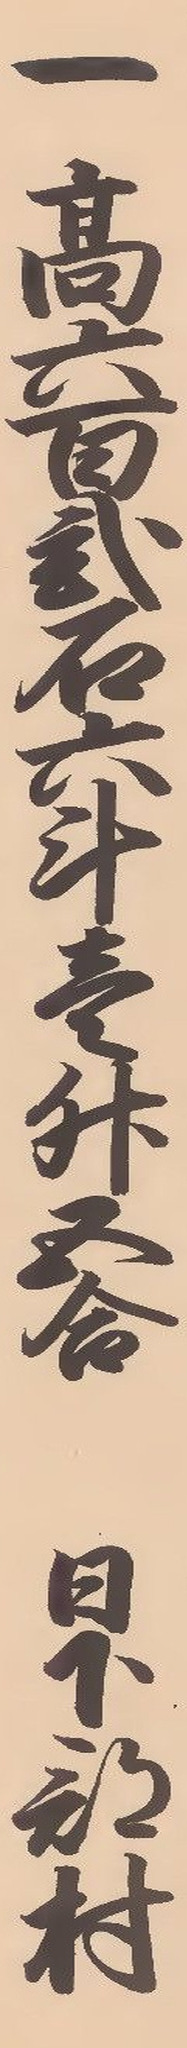一高六百弐石六斗壱升五合日下部村
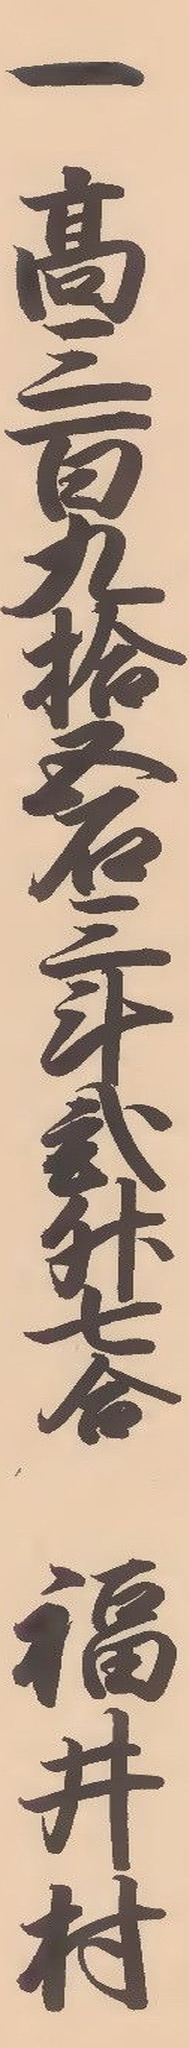一高三百九拾五石三斗弐升七合福井村
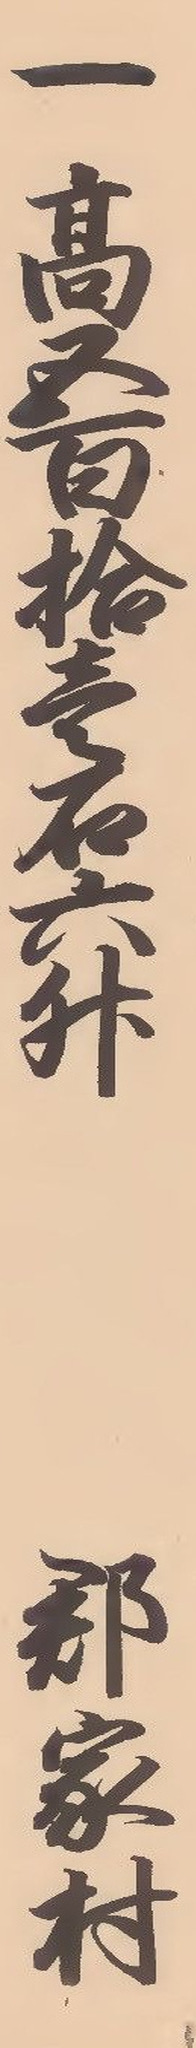一高五百拾壱石六升郡家村
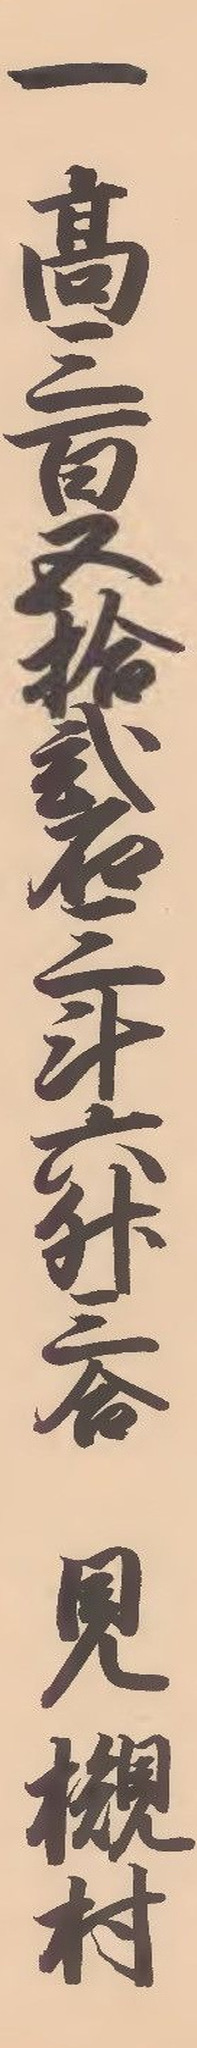一高三百五拾弐石三斗六升三合見槻村

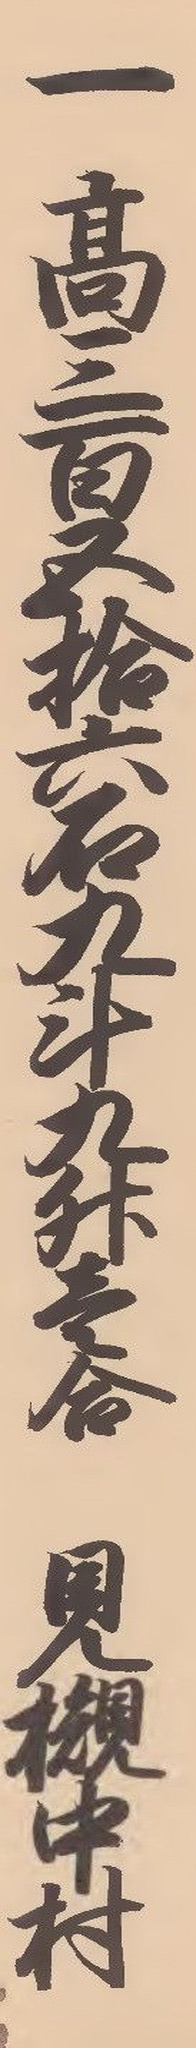一高三百五拾六石九斗九升壱合見槻中村
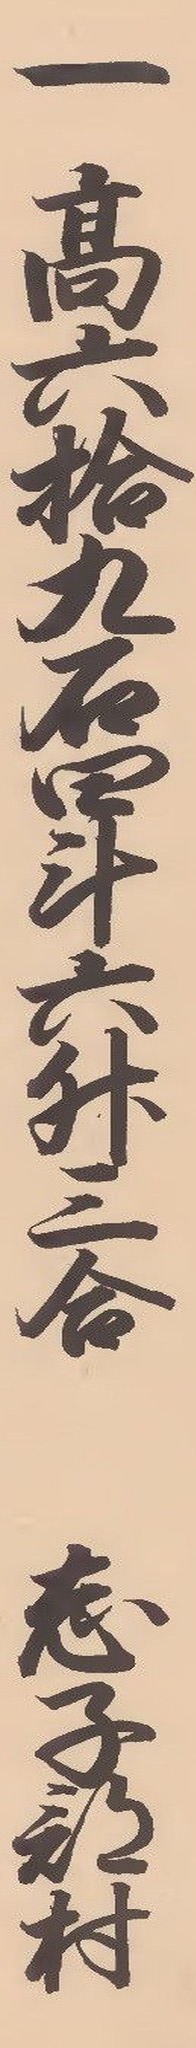一高六拾九石四斗六升三合志子部村
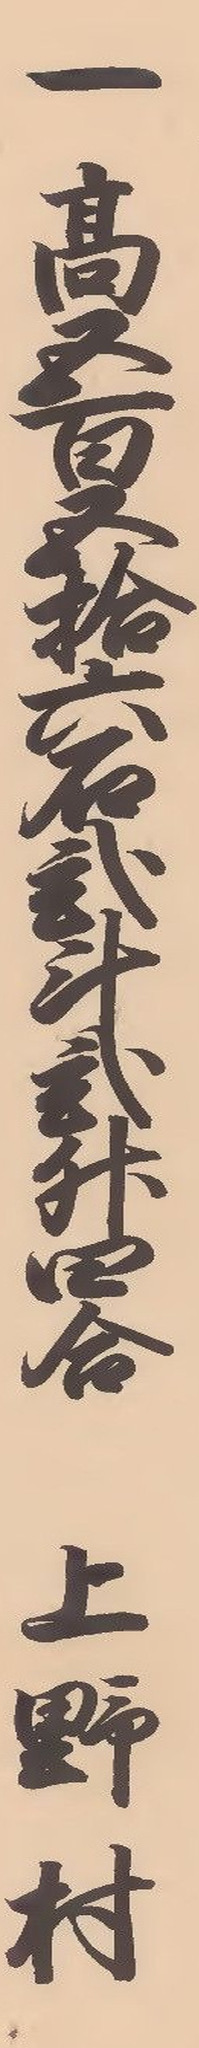一高五百五拾六石弐斗弐升四合上野村
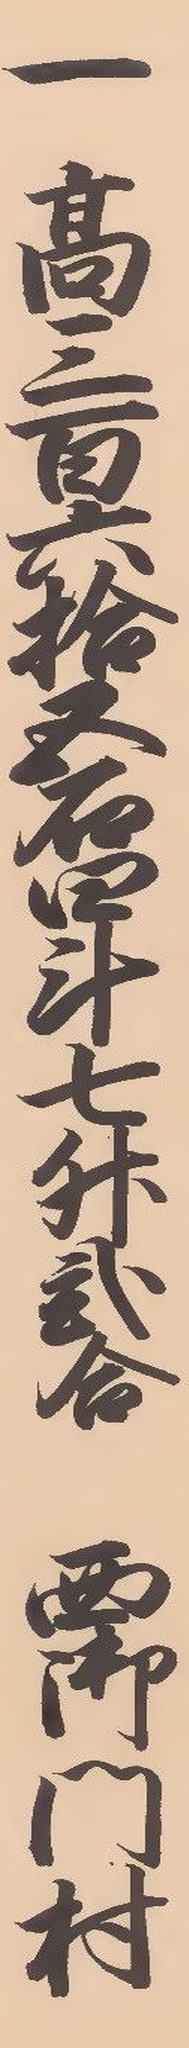一高三百六拾五石四斗七升弐合西御門村
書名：因幡国郷帳
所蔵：国立公文書館 National Archives of Japan
